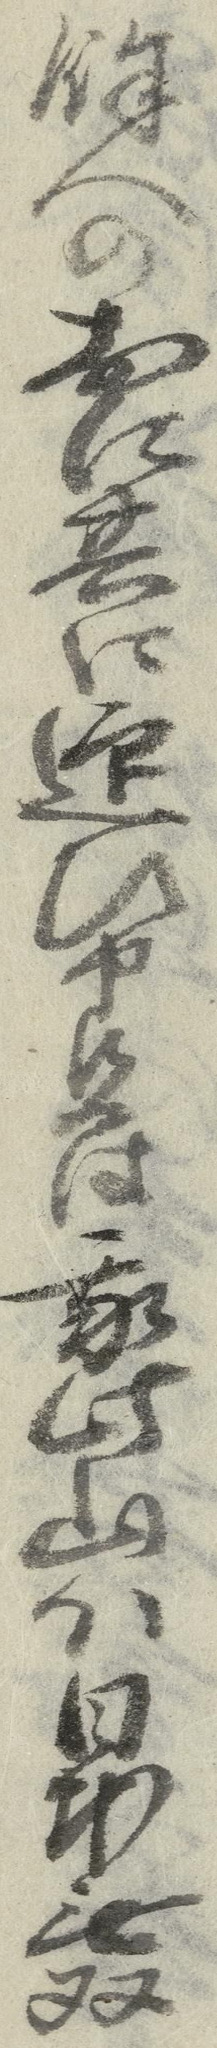餘人のおに共に迎ひ申けるは我此山外日本無双
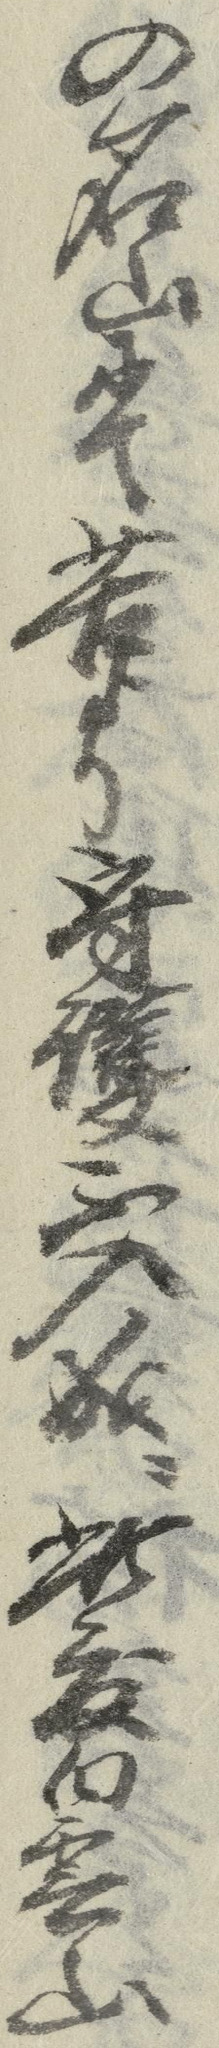の名山にて昔より守護ふ入成に此度白雲山
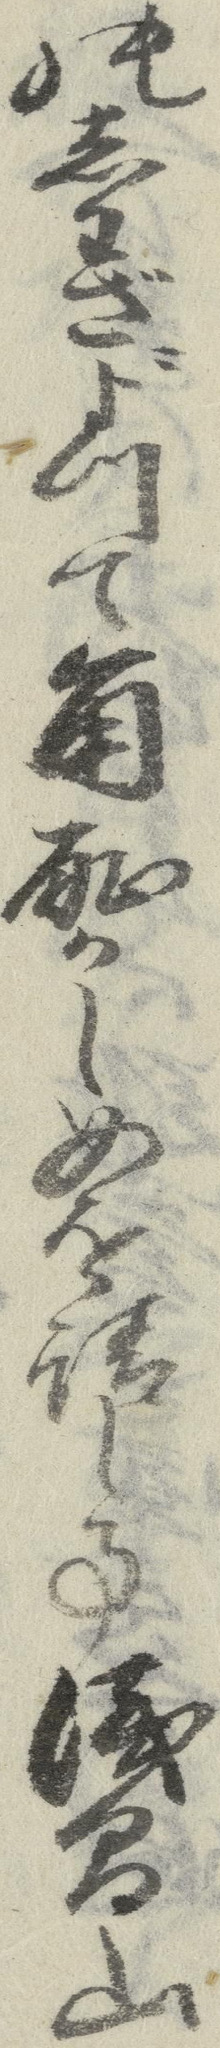のしわざによつて角恥かしめを請し事浅間山
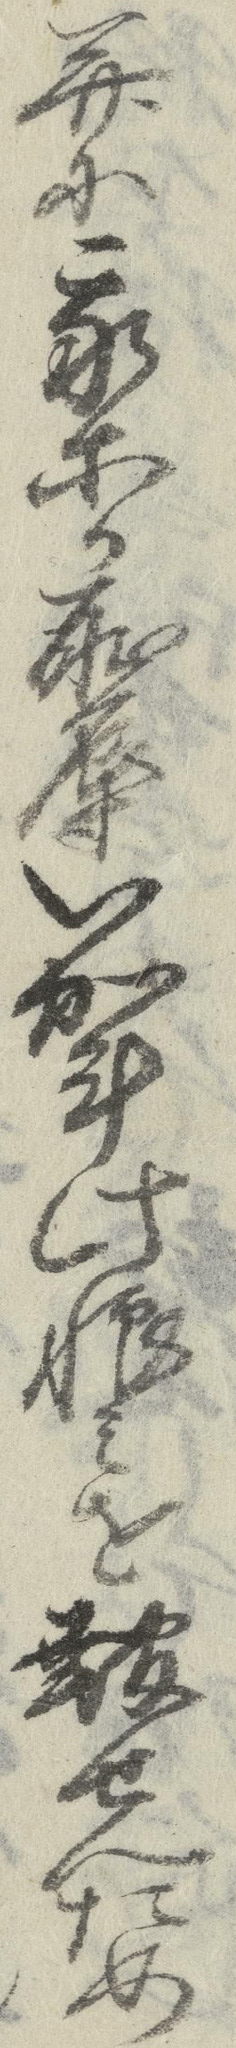幷に我等か恥辱いか計此恨みを報せんため
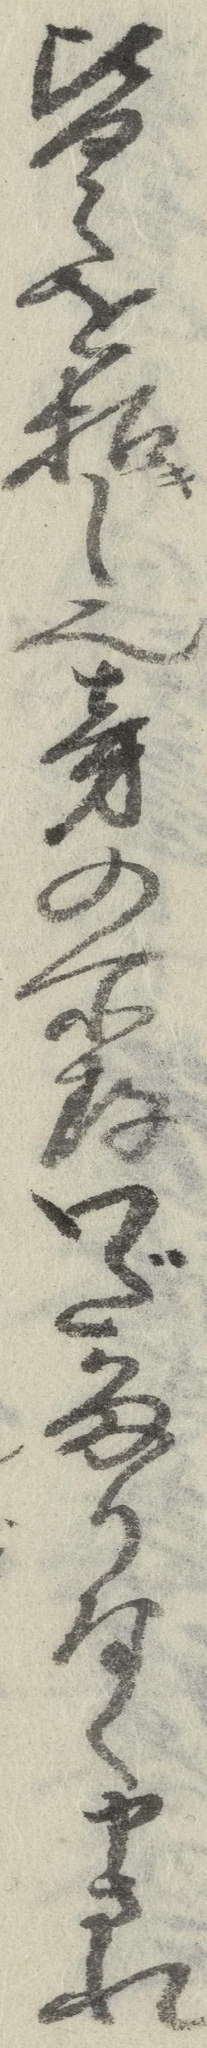皆々を招也旁の所存わだかまりなく申され
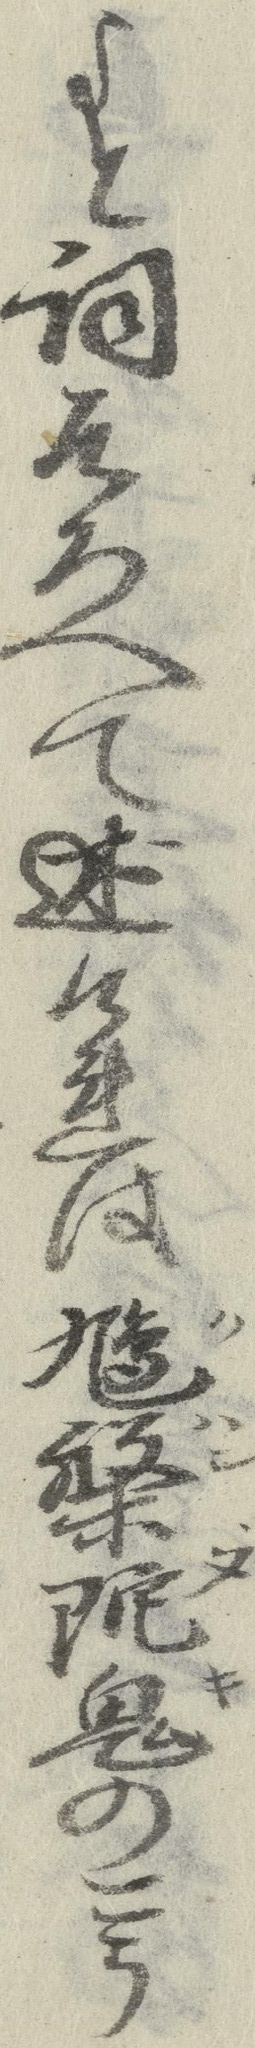よと詞そろへて述けれは鳩槃陀鬼のこう
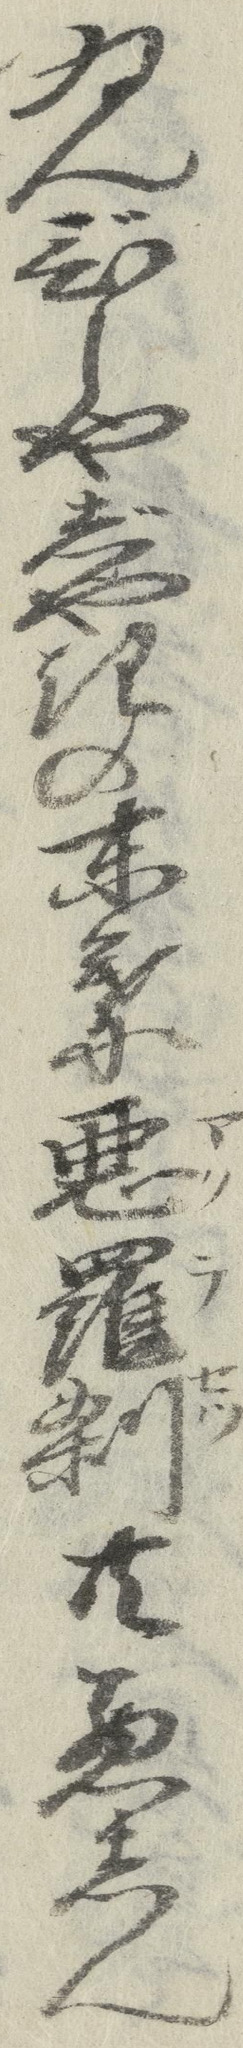ゐんびしやじやきの末葉悪羅刹共悪しん
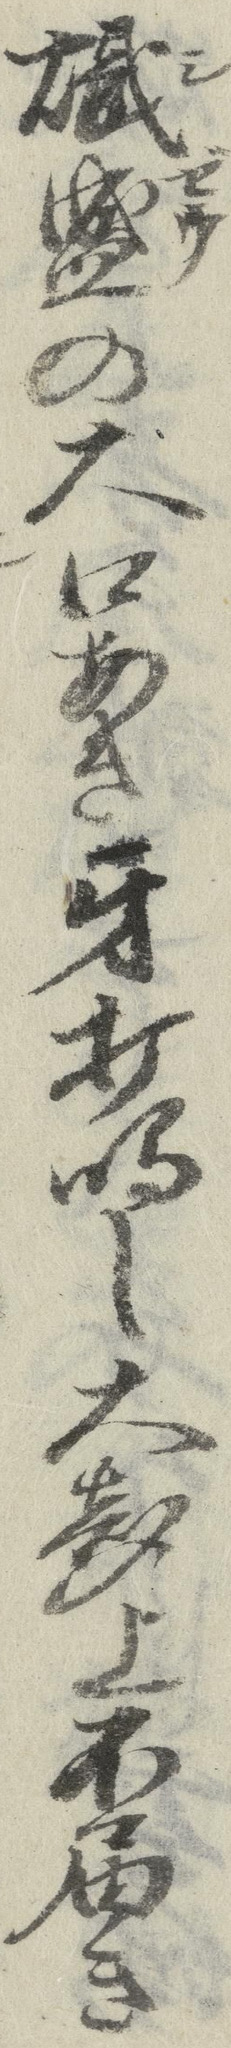碔盛の大口あき牙打鳴し大声上不届き
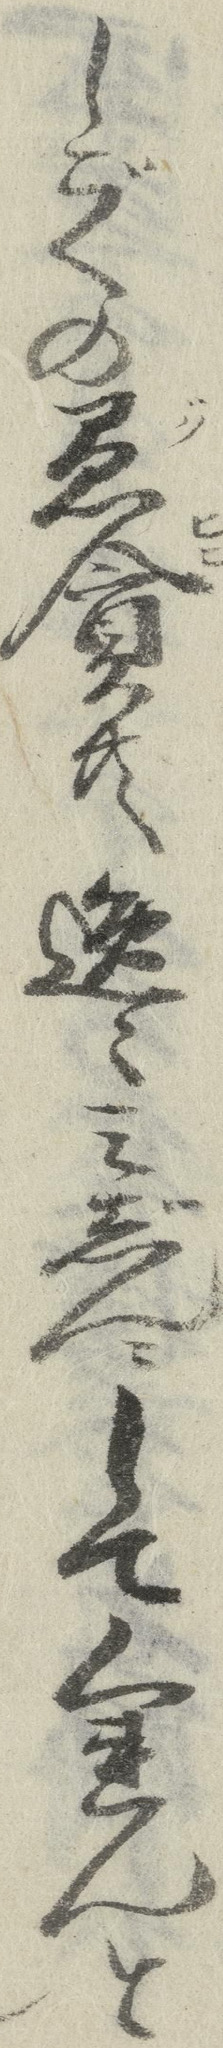しごくの愚貧共逸々みじんにしてくれんと
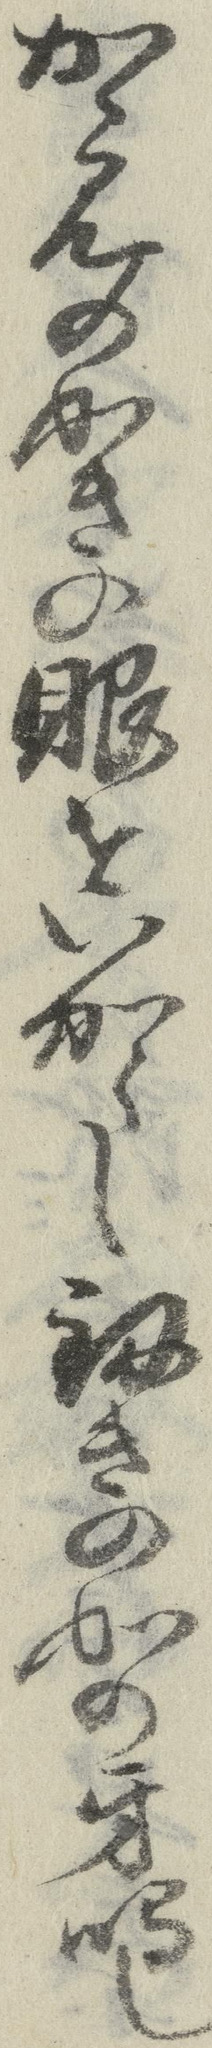かゝみの如きの眼をいからし釼きの如の牙鳴し

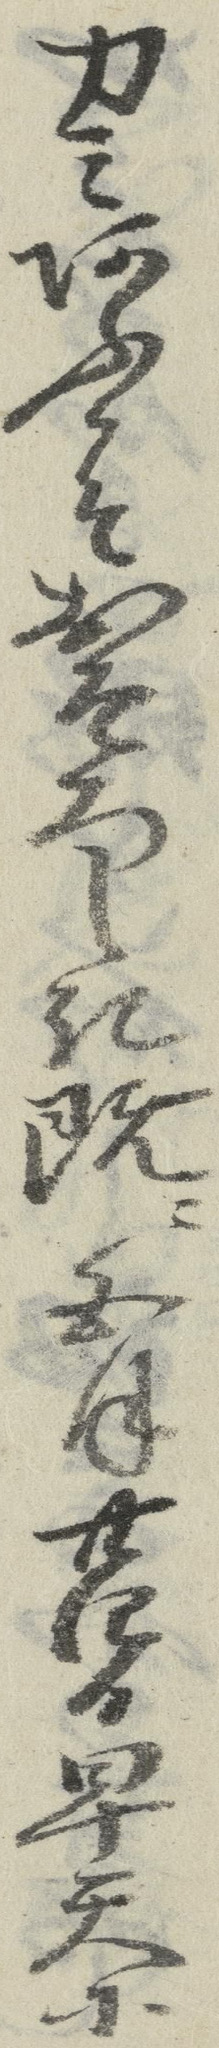力みあふとおそろしき既に五月廿四日早天に
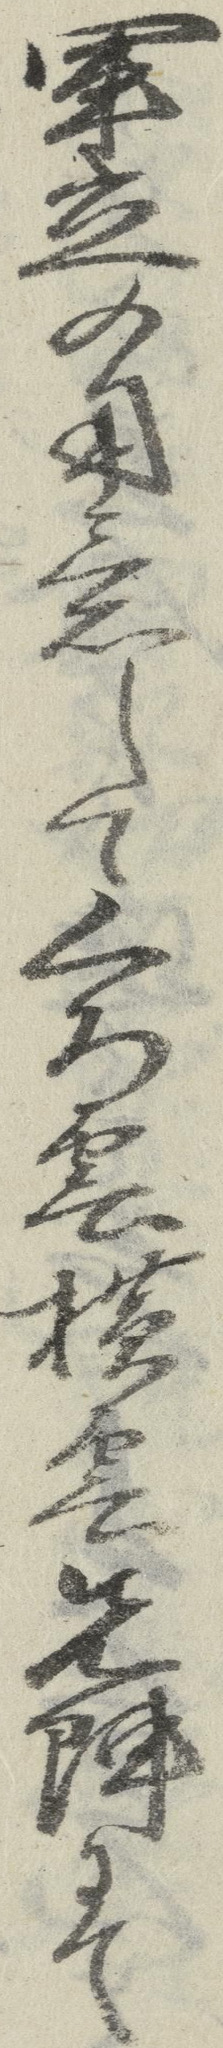軍立の用意してくろ雲横雲先陣にて
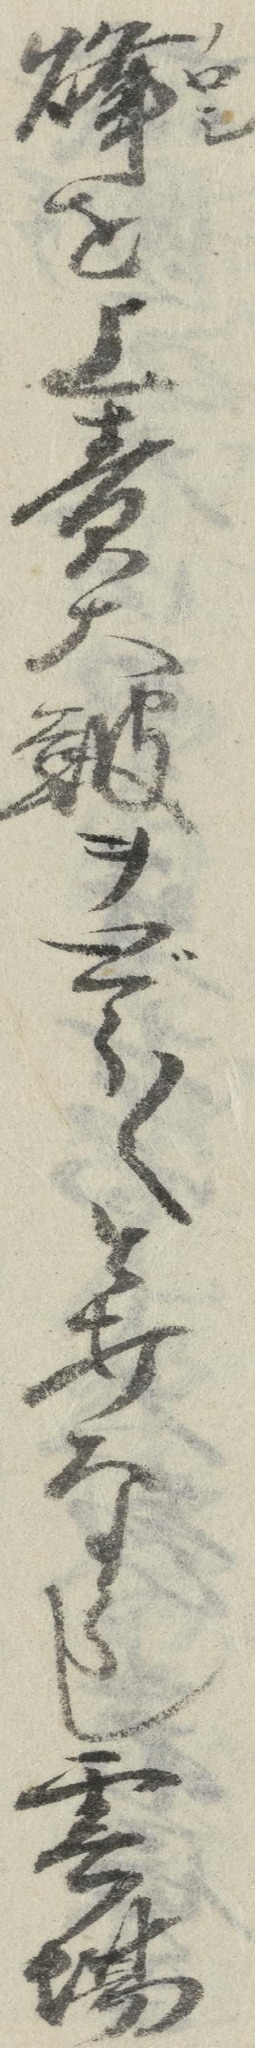烽を上責大鞁をどう〳〵と打ならし雲塲
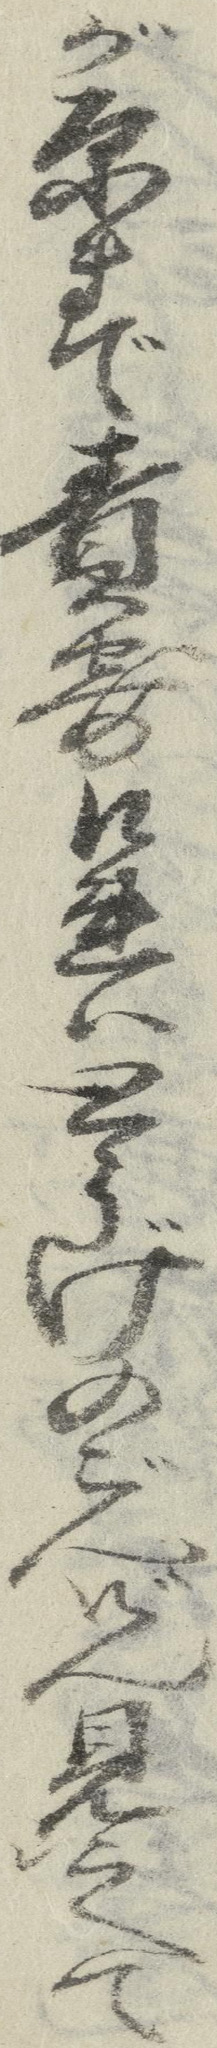が原まで責寄けれはとうげのごんげん見之て
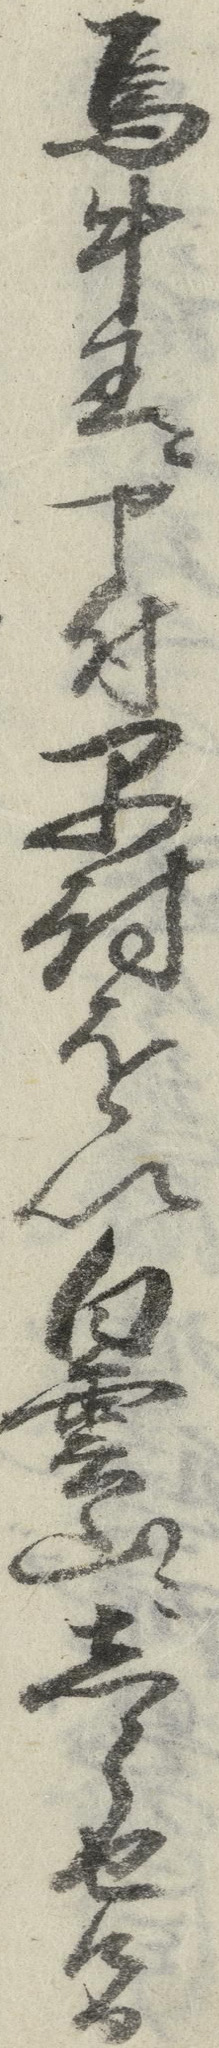鳥中主に申付早討を以白雲山にしらせける
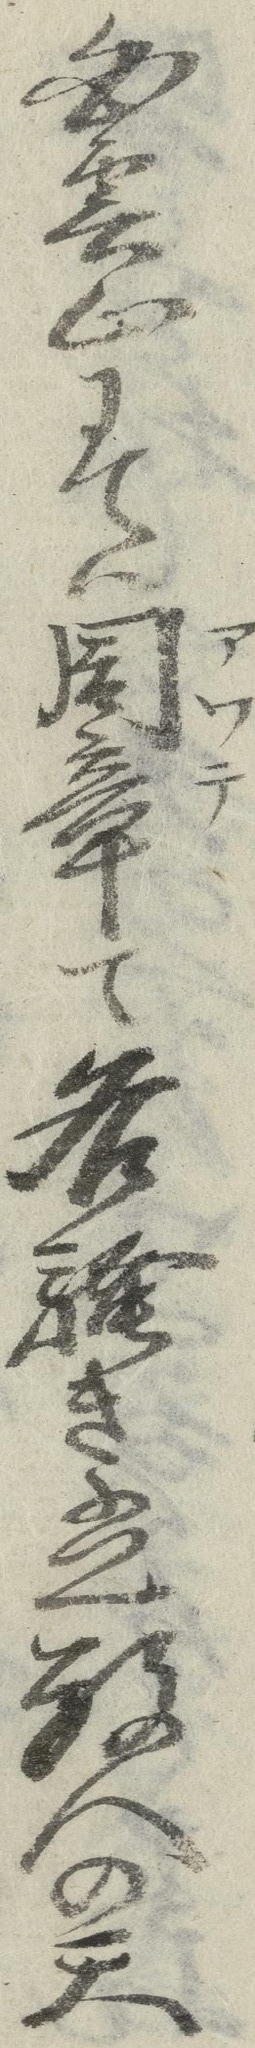白雲山にては周章て各騒き立数人の天
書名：浅間大焼騒動記　上
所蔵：東京大学地震研究所図書室 Earthquake Research Institute Library, The University of Tokyo, JAPAN
